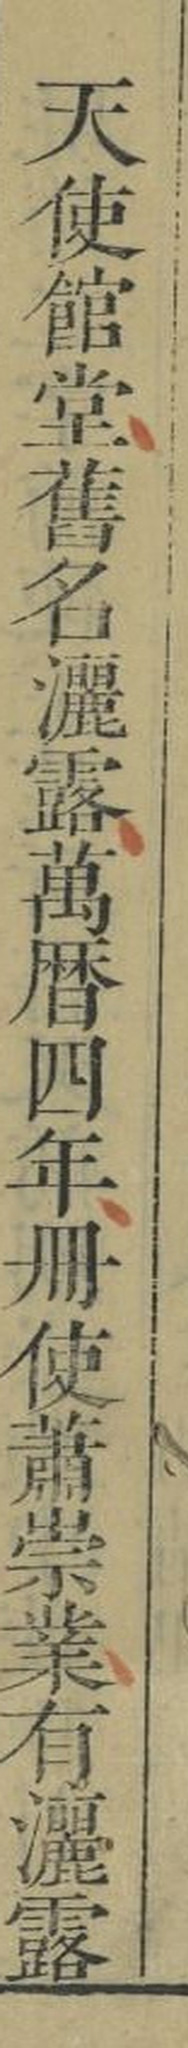天使館堂舊名灑露萬暦四年冊使蕭崇業有灑露
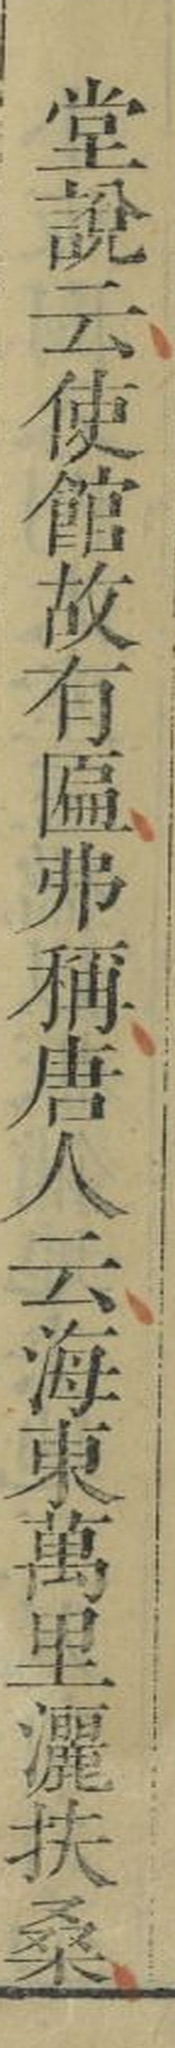堂說云使館故有匾弗稱唐人云海東萬里灑扶桑
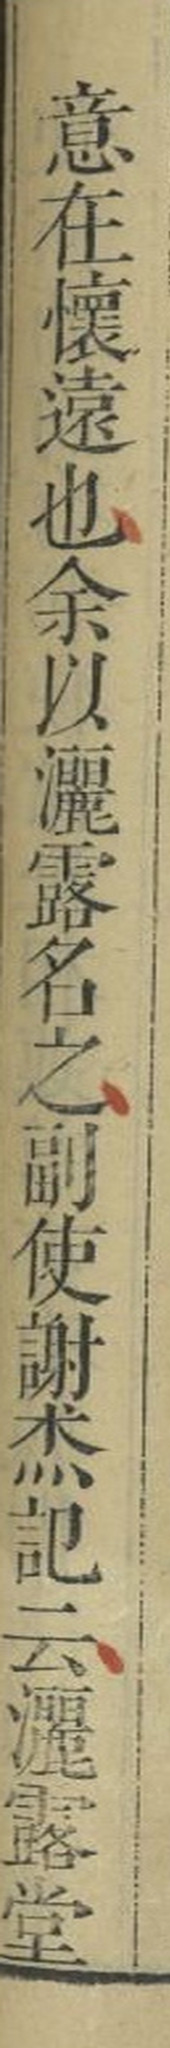意在懷遠也余以灑露名之副使謝杰記云灑露堂
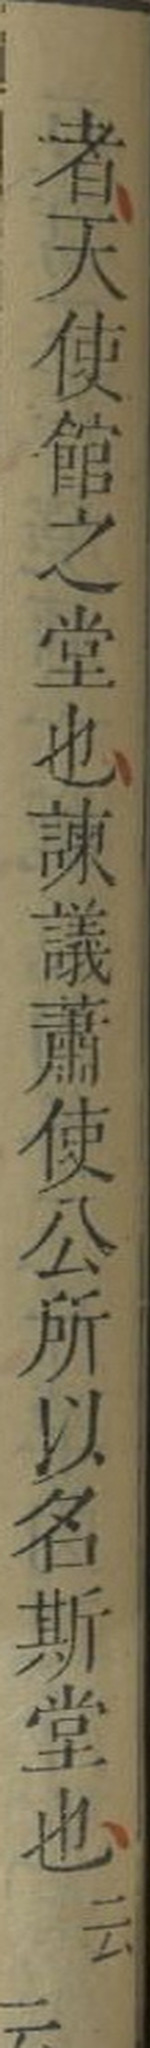者天使館之堂也諫議蕭使公所以名斯堂也云云
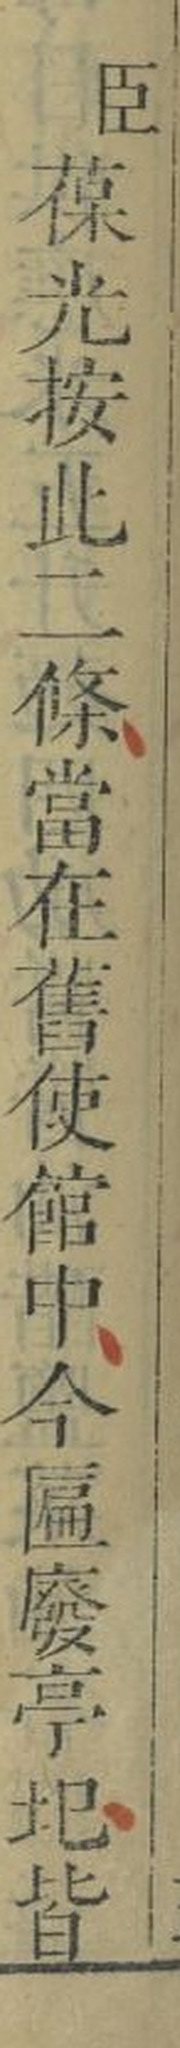臣葆光按此二條當在舊使館中今匾廢亭圯皆
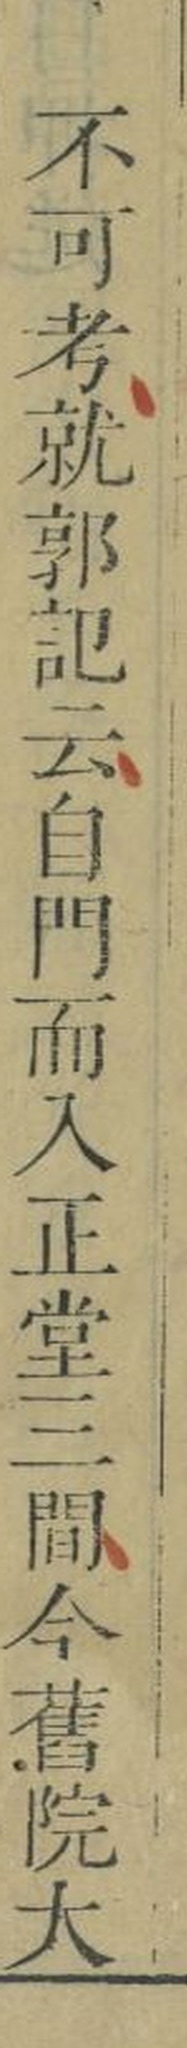不可考就郭記云自門而入正堂三間今舊院大
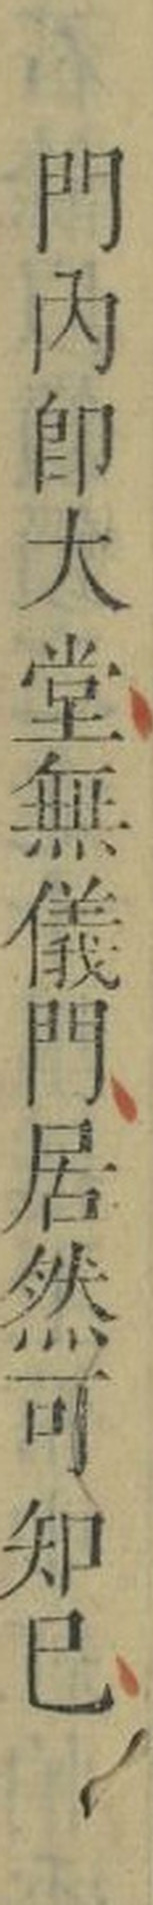門内卽大堂無儀門居然可知巳
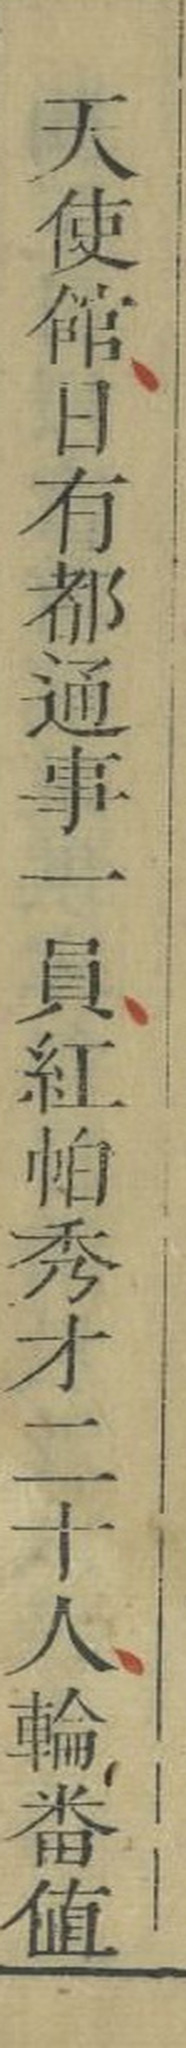天使館日有都通事一員紅帕秀才二十人輪畨値
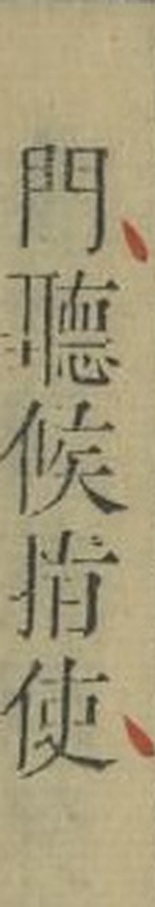門聽候指使
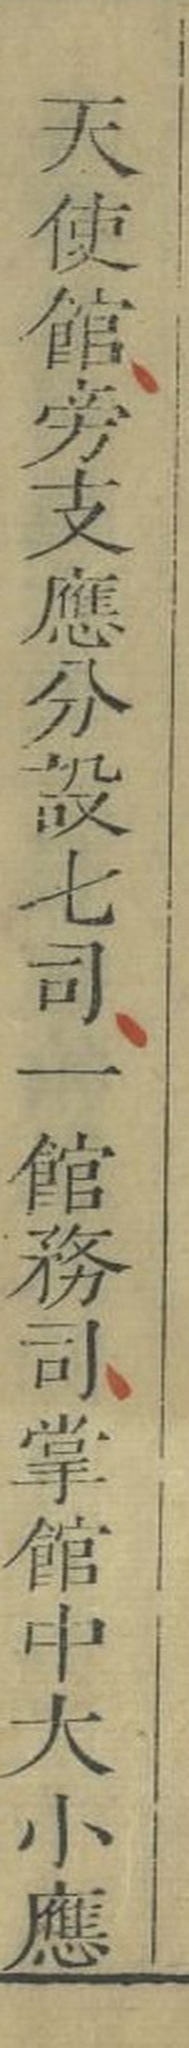天使館旁支應分設七司一館務司掌館中大小應
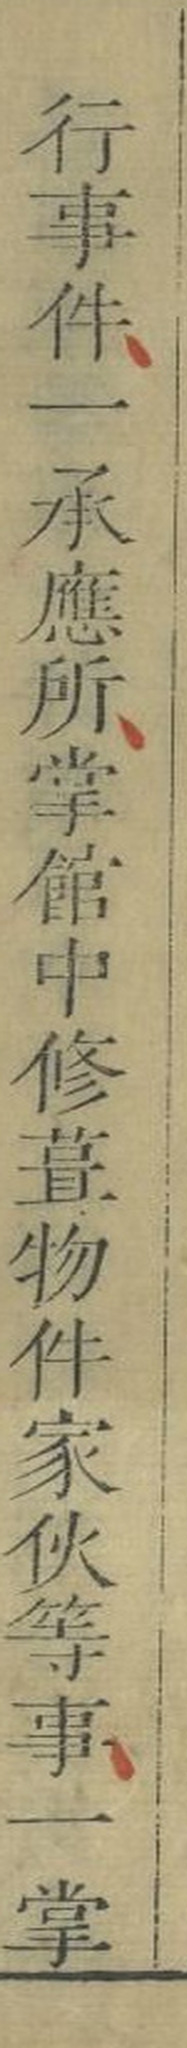行事件一承應所掌館中修葺物件家伙等事一掌
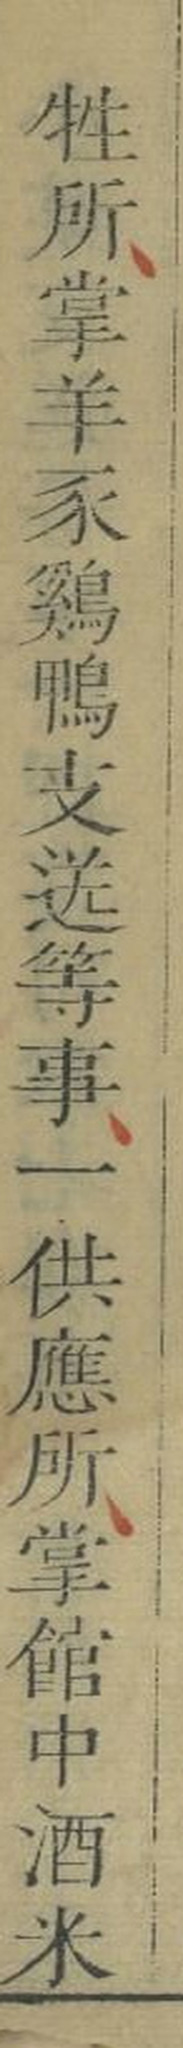牲所掌羊豕鷄鴨支送等事一供應所掌館中酒米

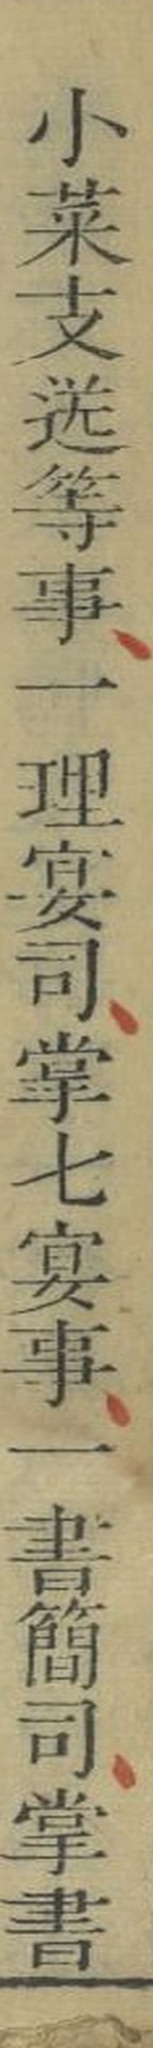小菜支送等事一理宴司掌七宴事一書簡司掌書
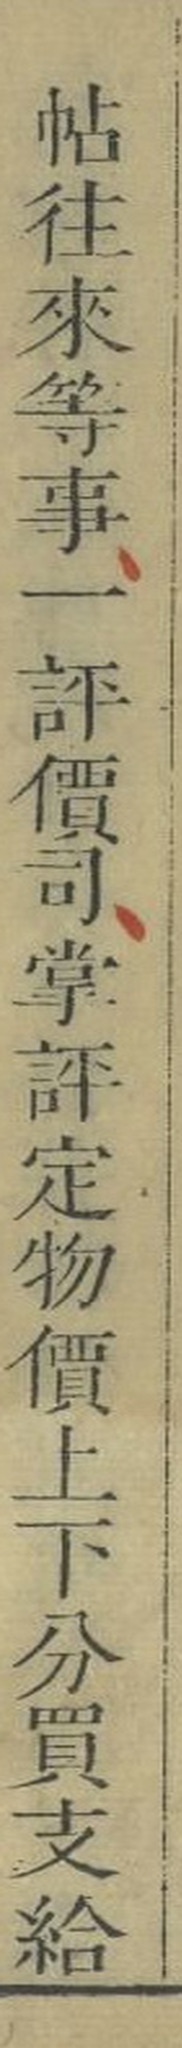帖往來等事一評價司掌評定物價上下分買支給
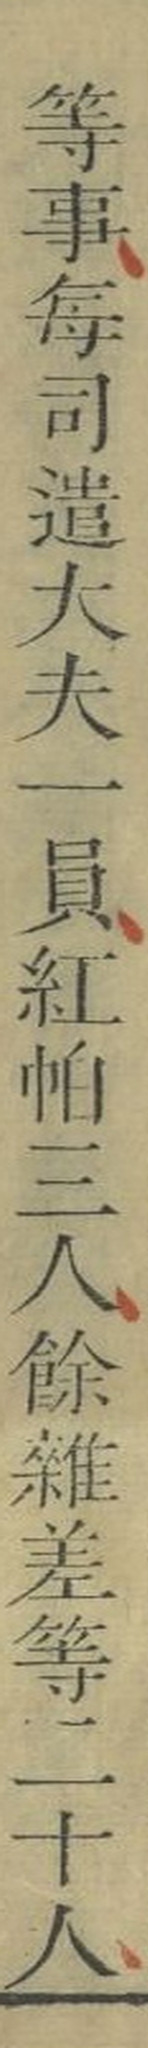等事每司遣大夫一員紅帕三人餘雜差等二十人
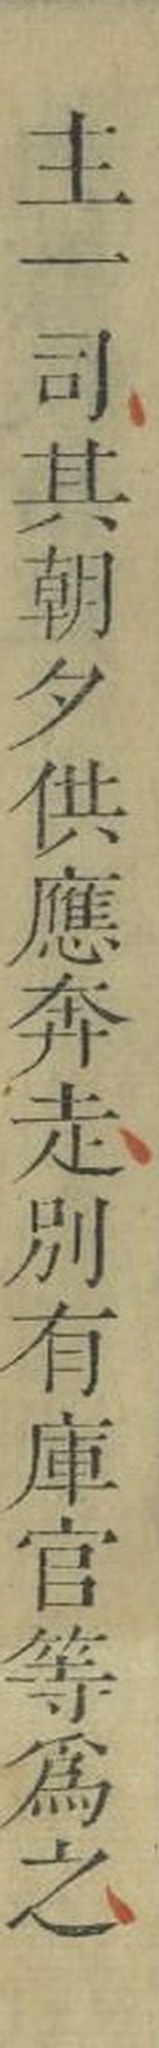主一司其朝夕供應奔走別有庫官等爲之
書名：中山伝信録 巻一、巻二
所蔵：University of the Ryukyus Library
